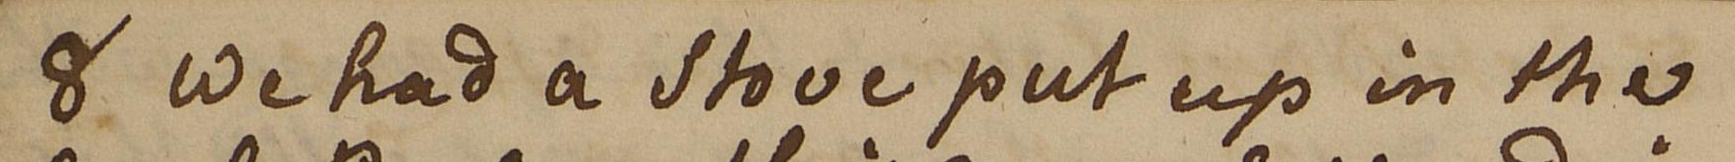8 we had a Stove put up in the
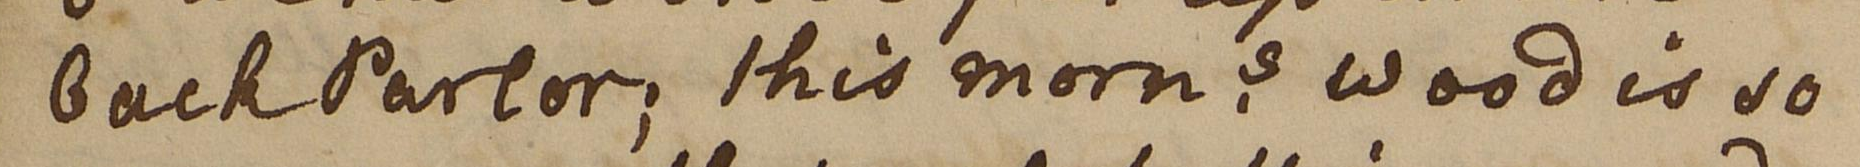back Parlor; this morn^g. wood is so
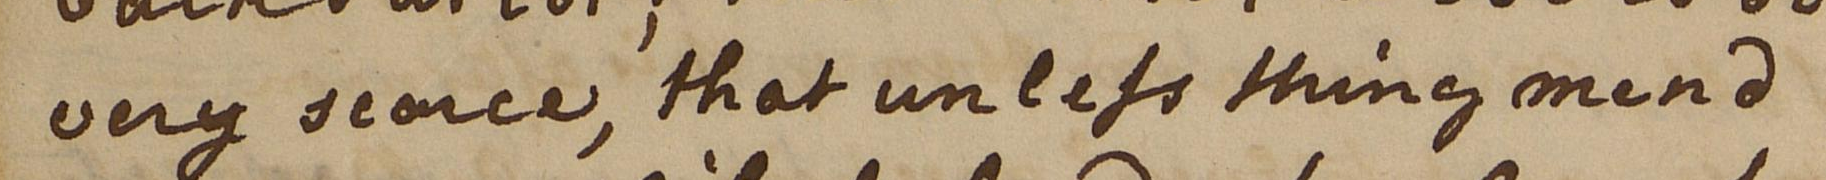very scarce, that unless thing mend
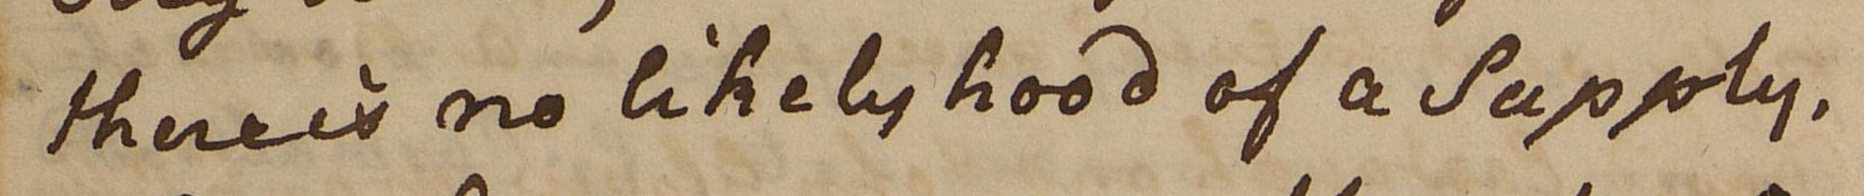there is no likelyhood of a Supply,
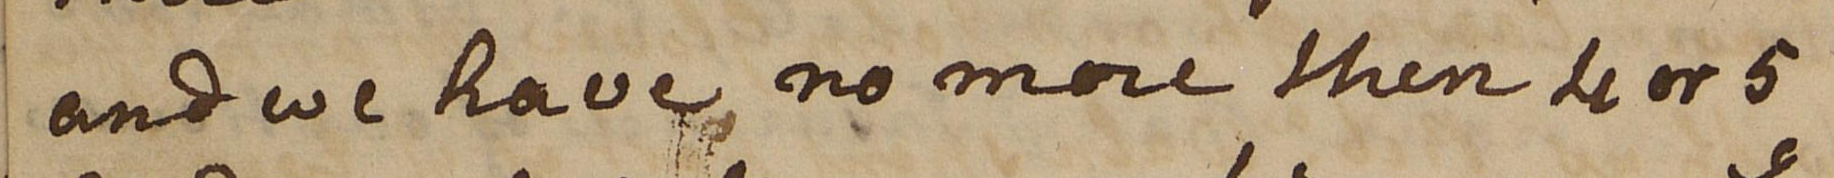and we have no more then 4 or 5
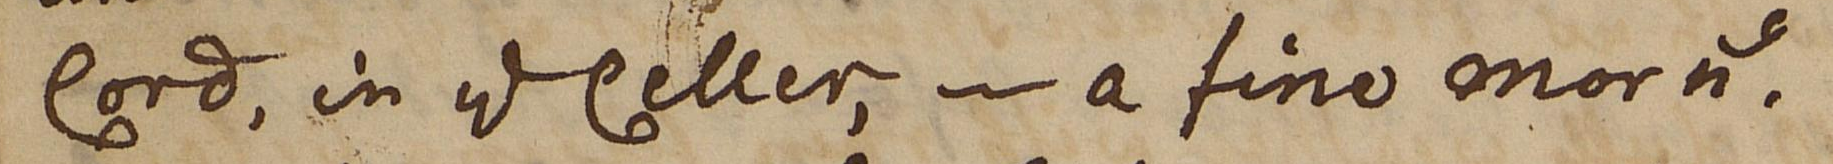Cord, in y^e celler - a fine morn^g.
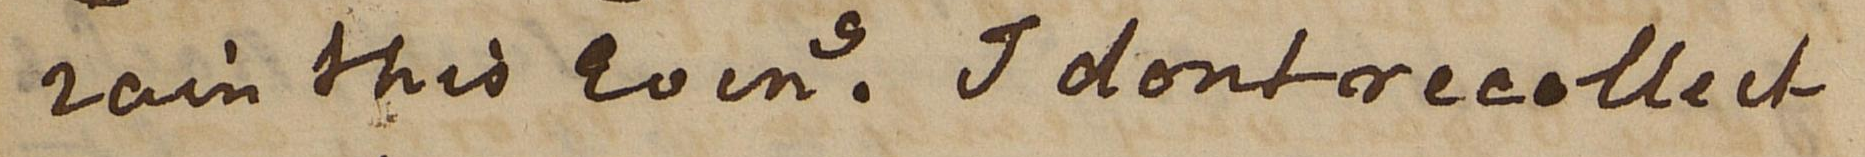rain this Even^g. I dont recollect
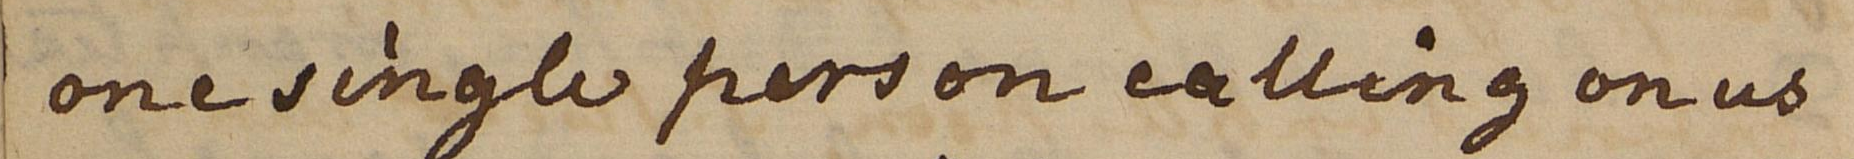one single person calling on us
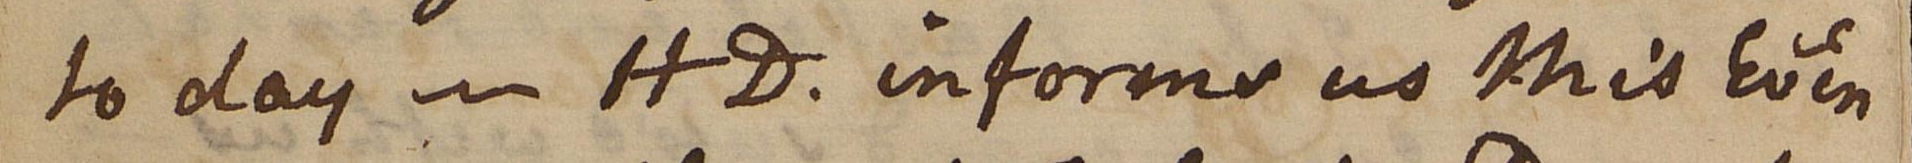to day-HD. informs us this Even^g
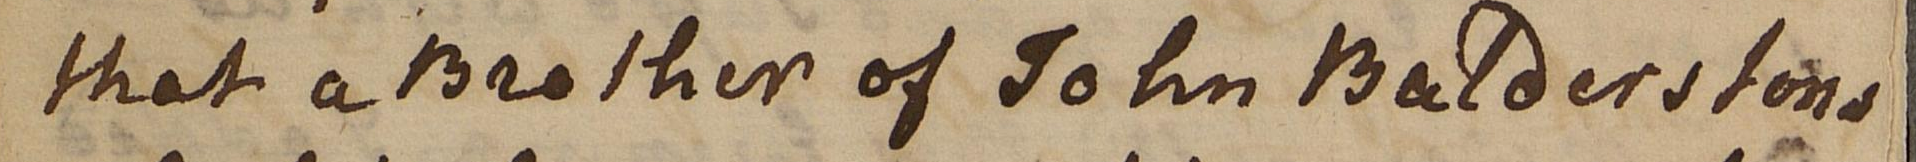that a Brother of John Balderstorns
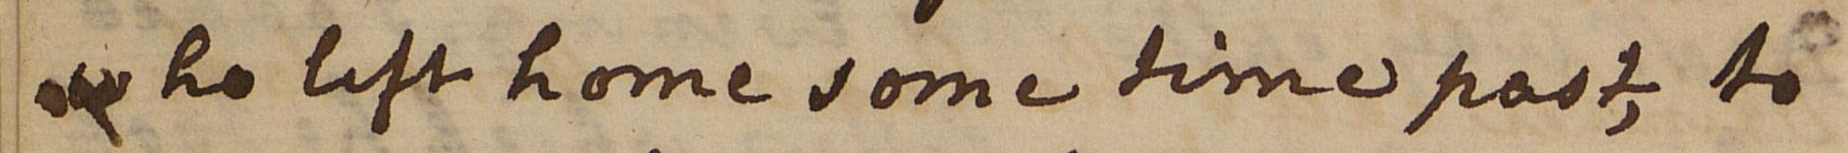who left home some time past, to
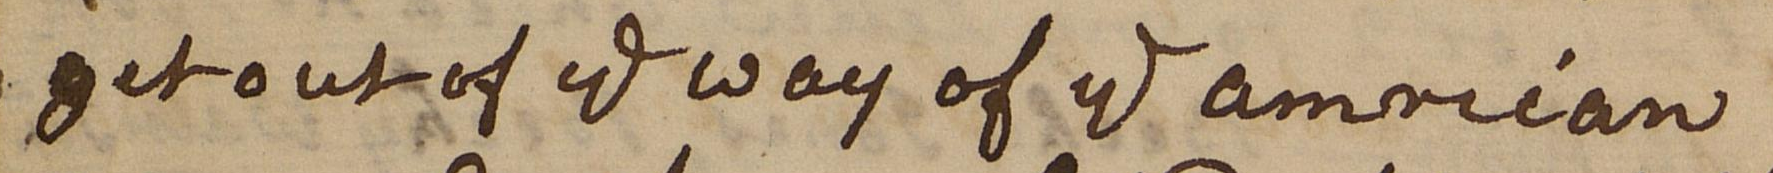get out of y^e way of y^e Amrican
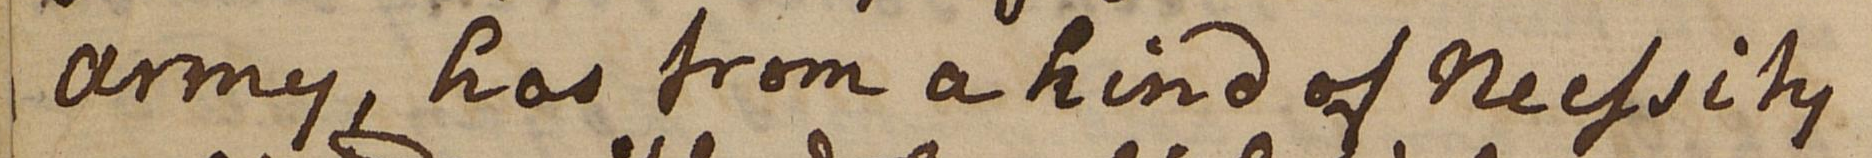Army, has from a kind of Necssity
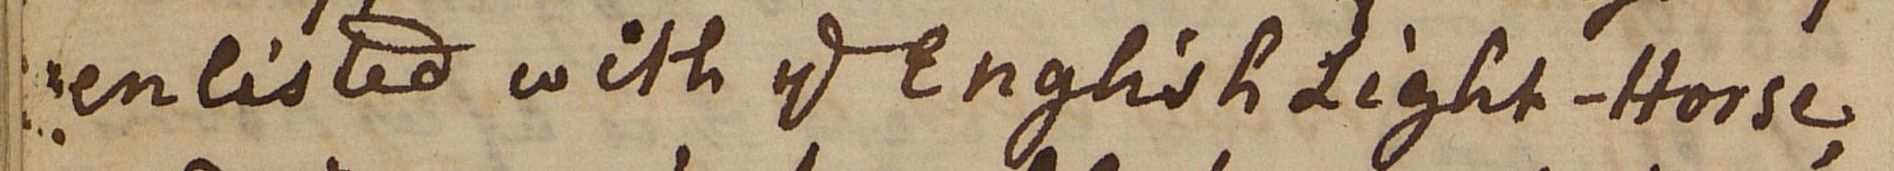enlisled with y^e English Light-Horse,
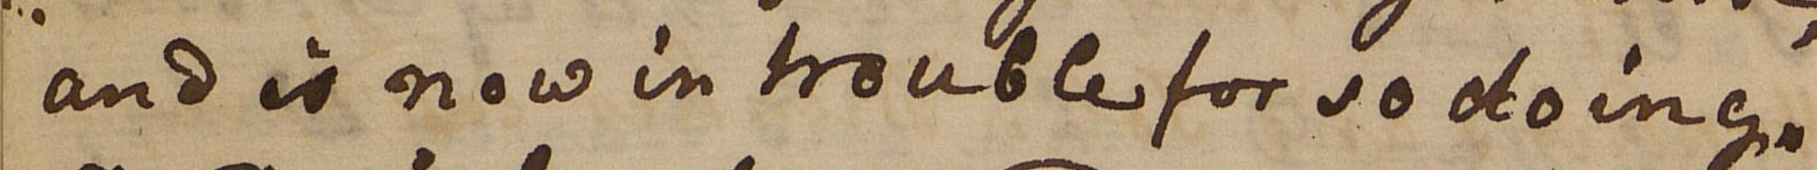and is now in trouble for so doing,
